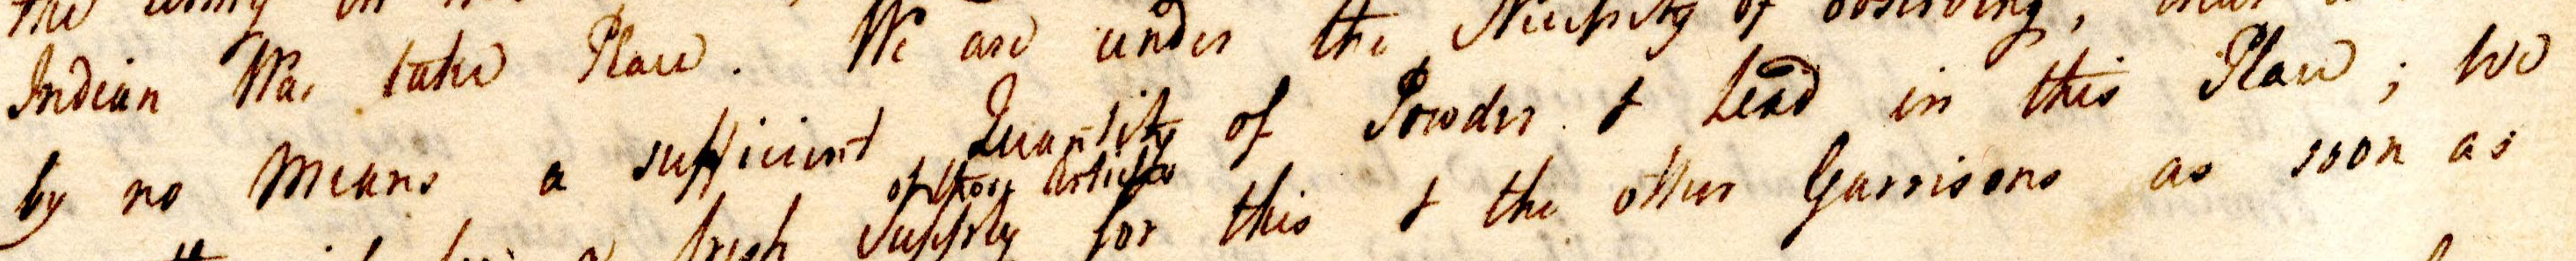by no means a sufficient Quantity of Powder & Lead in this Place; we
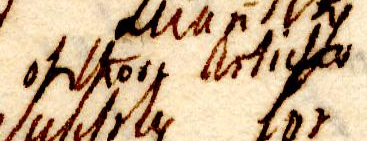of store Articles
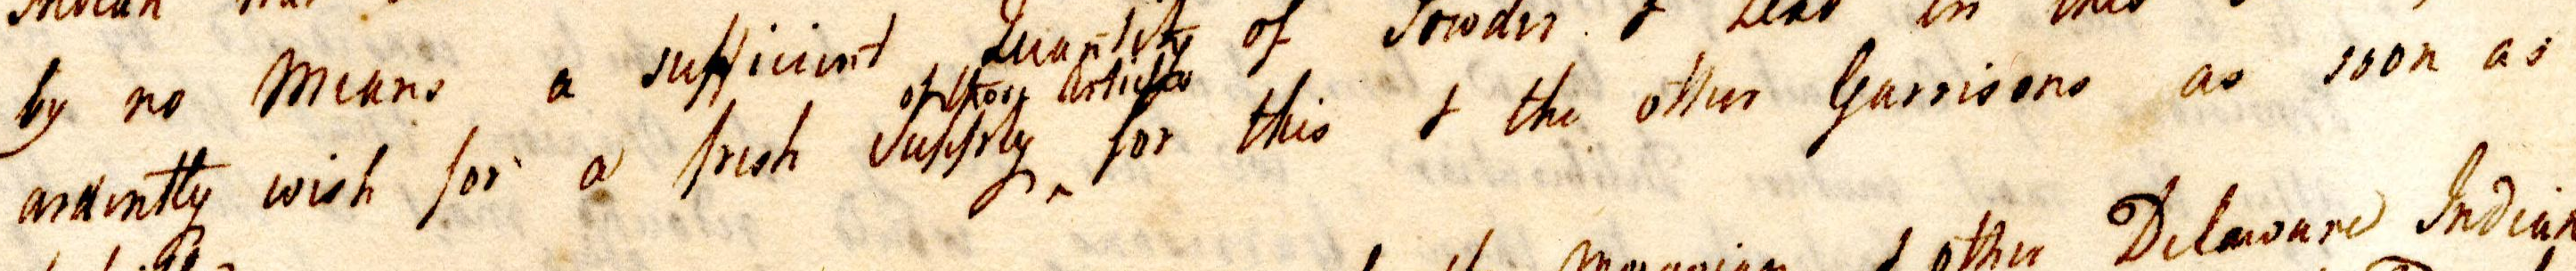ardently wish for a fresh Supply ^ for this & the other Garrisons as soon as
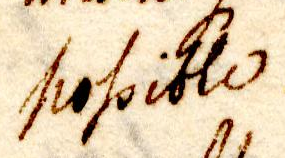possible.
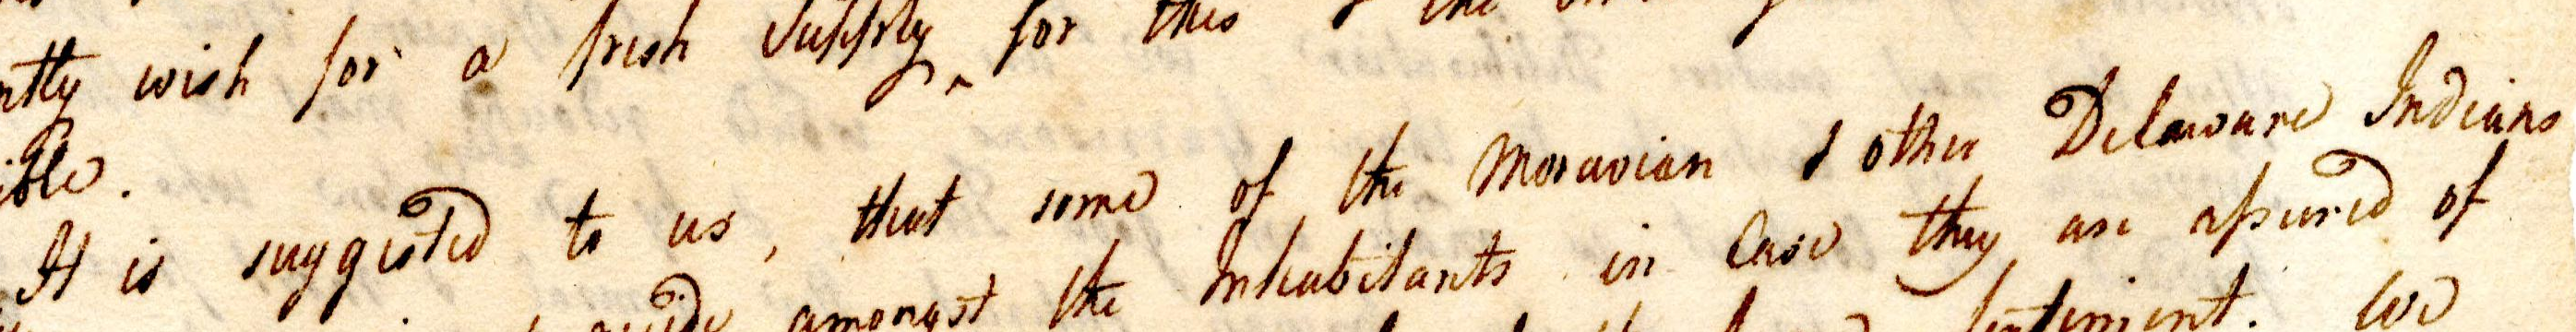It is suggested to us, that some of the Moravian & other Delaware Indians
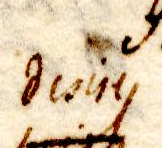desire
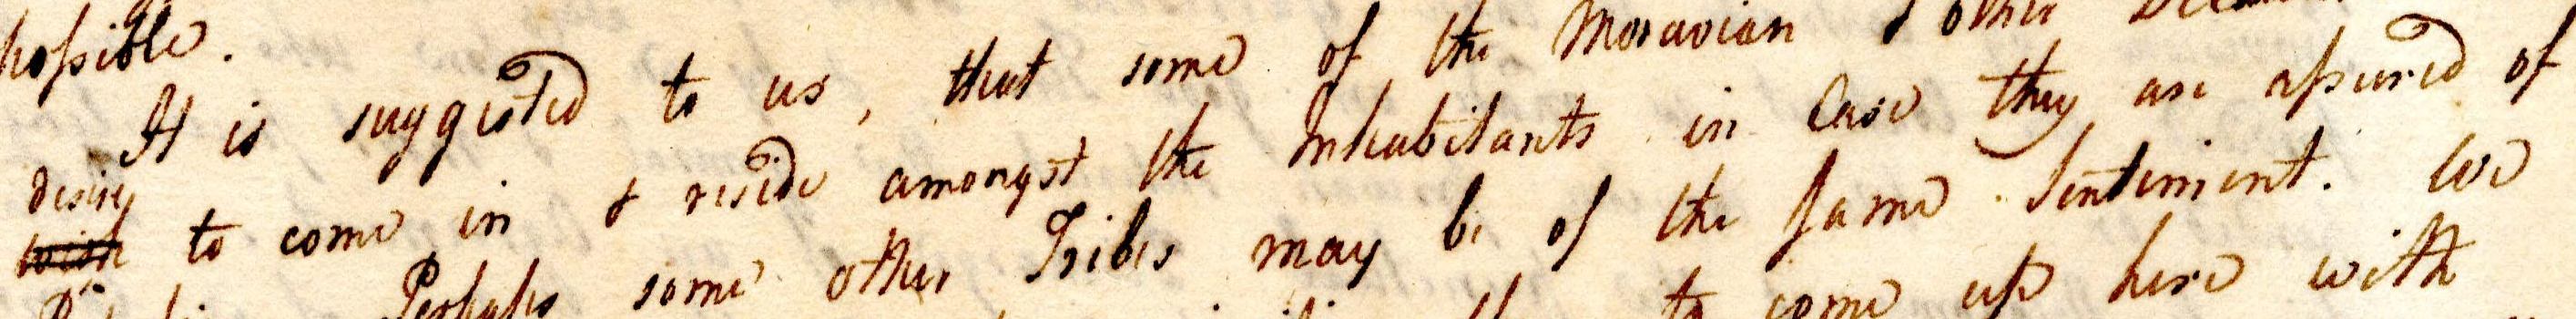wish to come in & reside amongst the Inhabitants in Case they are assured of
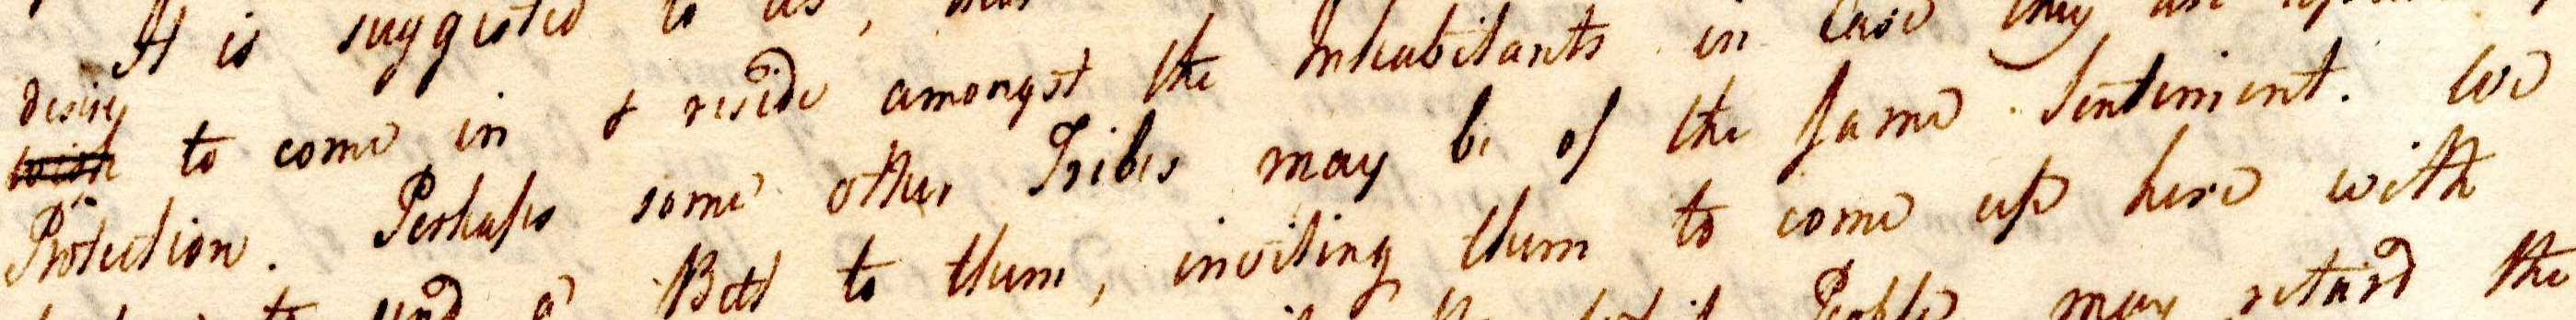Protection. Perhaps some other Tribes may be of the same Sentiment. We
